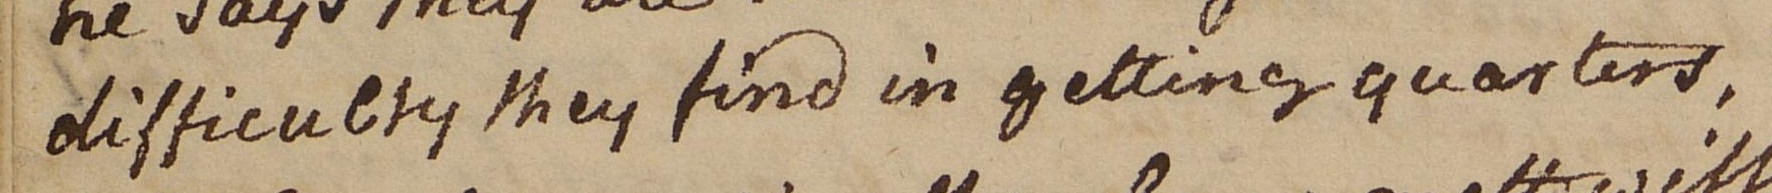difficulty they find in getting quarters,
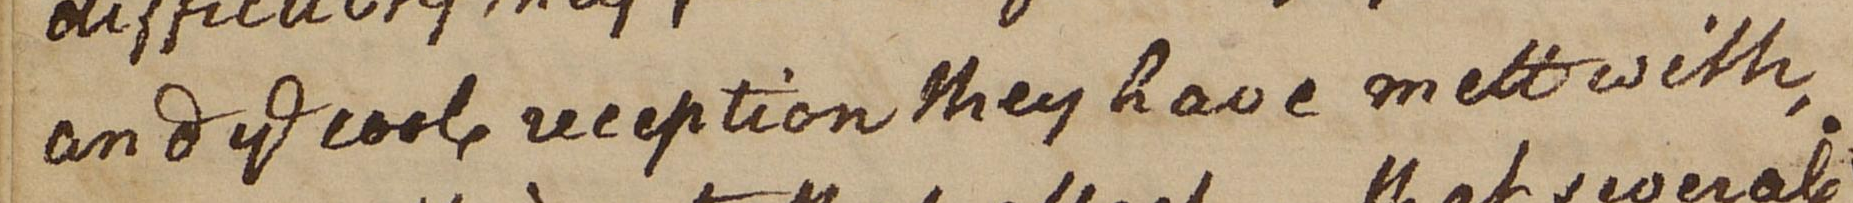and y^e cool reception they have mett with,
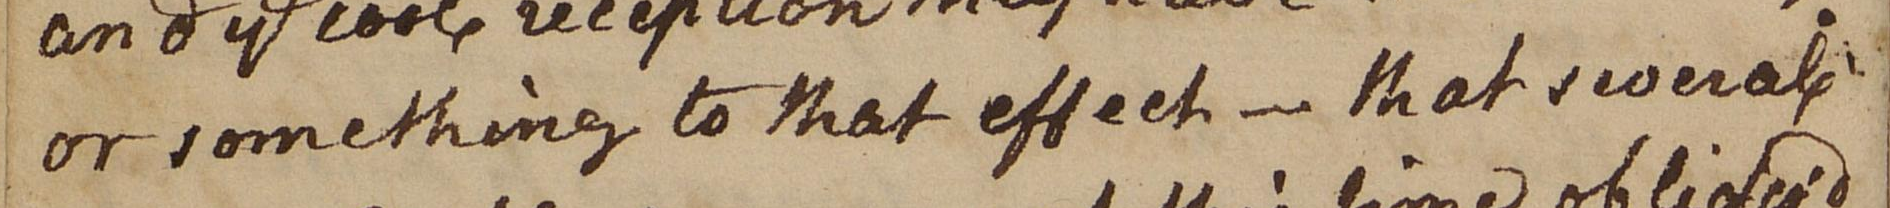or something to that effect- that several
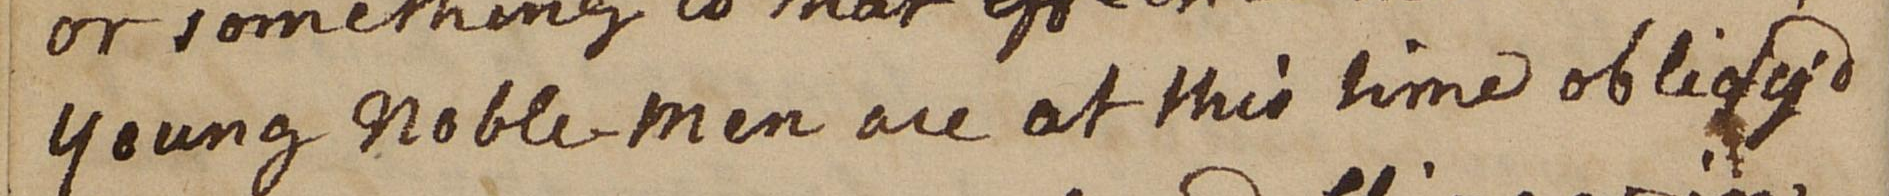Young Noble men are at this time oblidg'd
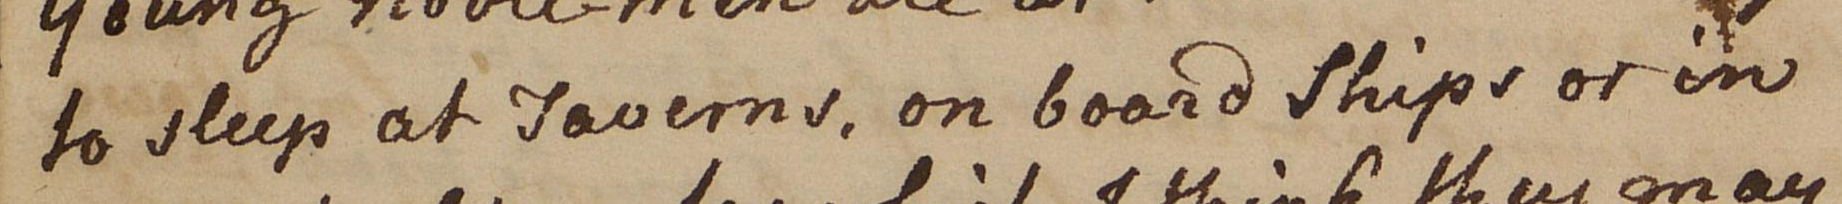to sleep at Taverns, on board Ships or in
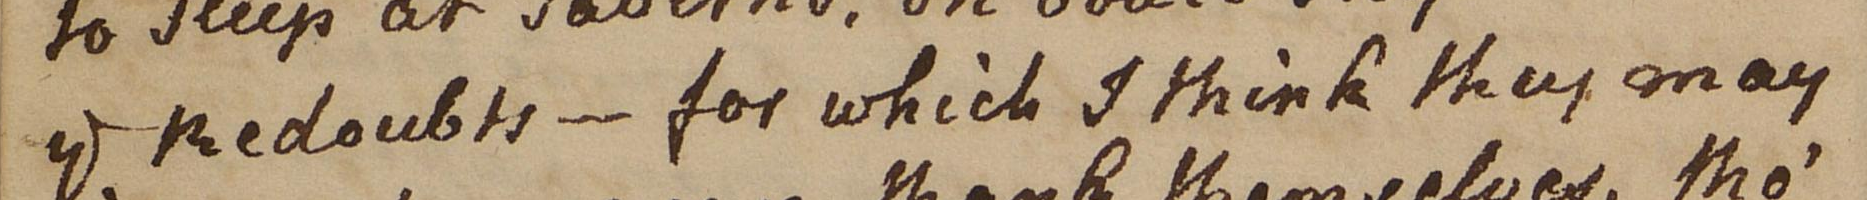y^e Redoubts- for which I think they may
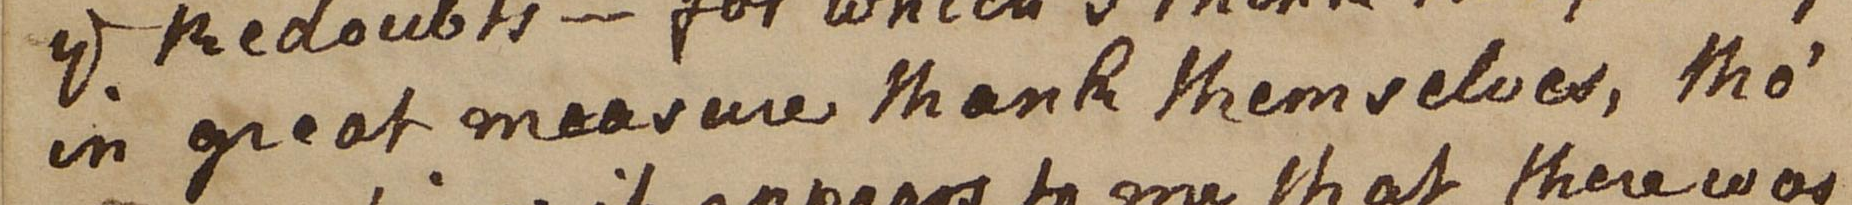in great measure thank themselves, tho'
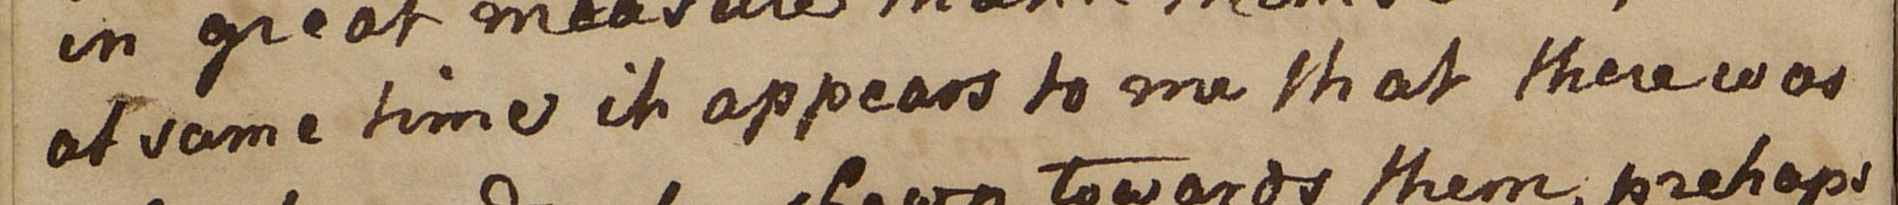at same times it appears to me that there was
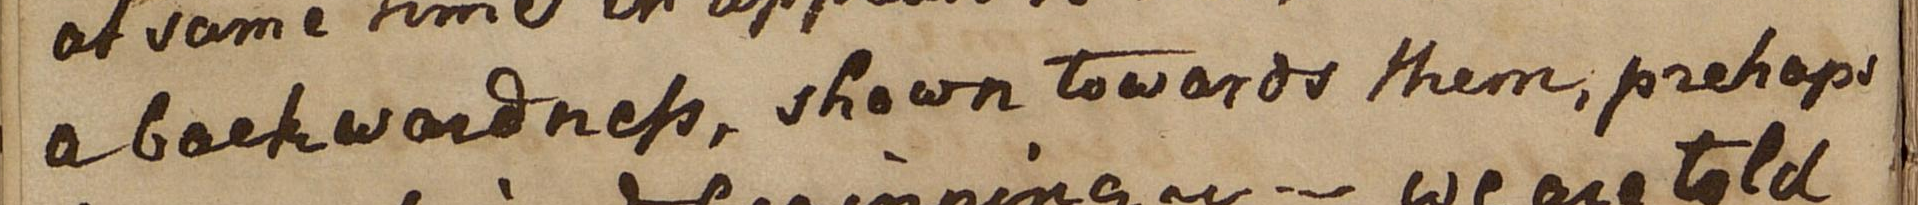a backwardness, shown towards them, prehaps
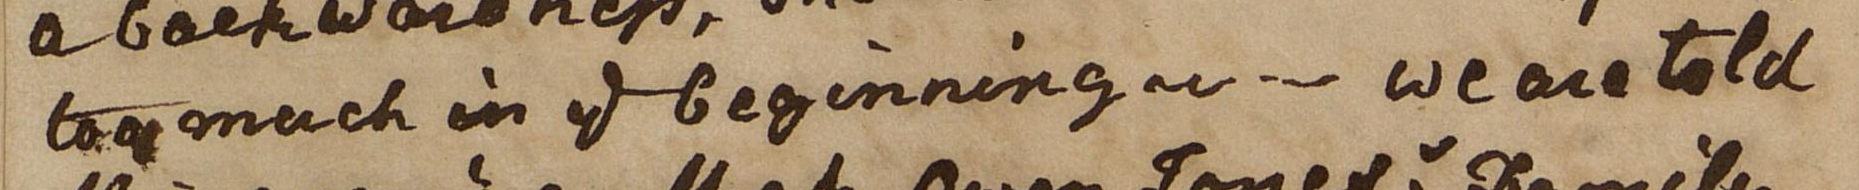too much in y^e beginning as- we are told
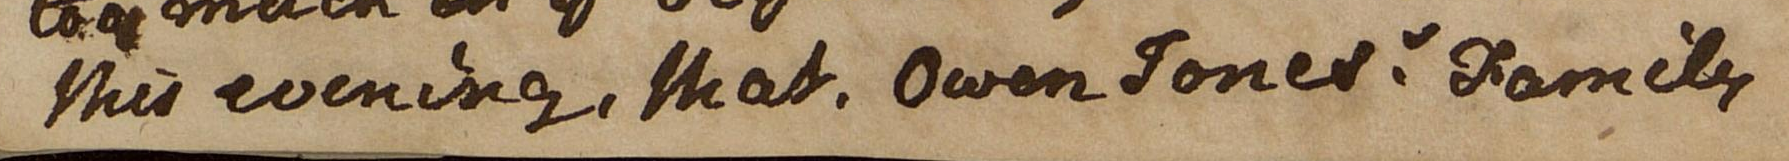this evening, that. Owen Jones^s. Family
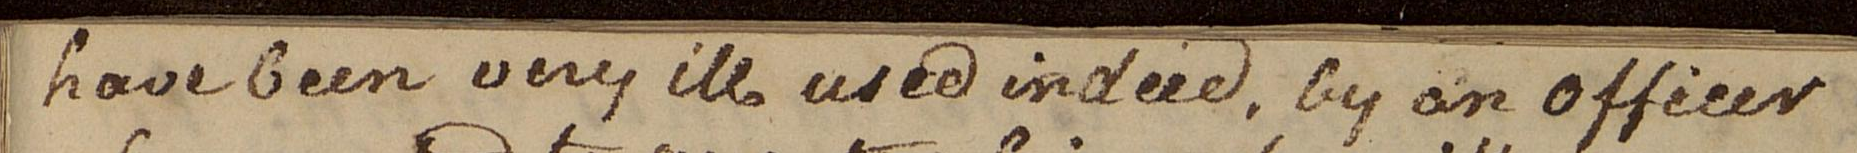have been very ill used indeed, by an officer
